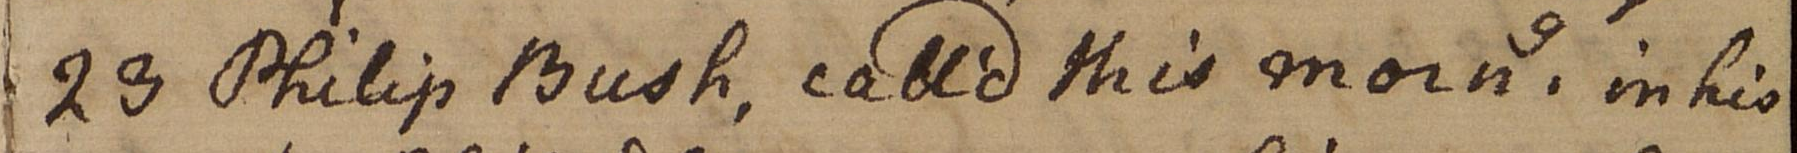23 Philip Bush, call'd this morn^g. in his
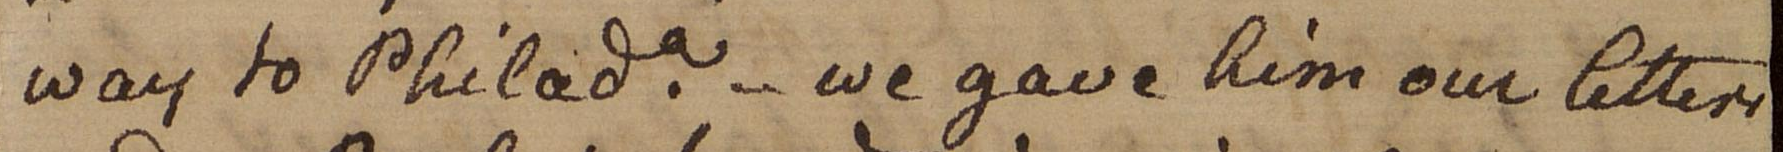way to Philad^a.- we gave him our letters
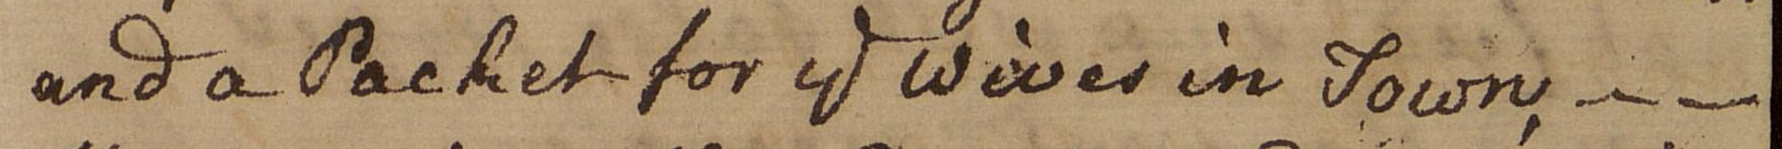and a Packet for y^e wives in Town,--
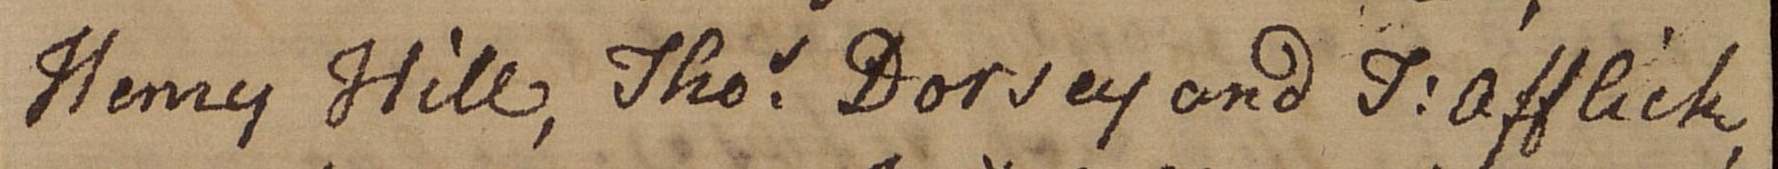Henry Hill, Tho^s. Dorsey and T: Afflick,
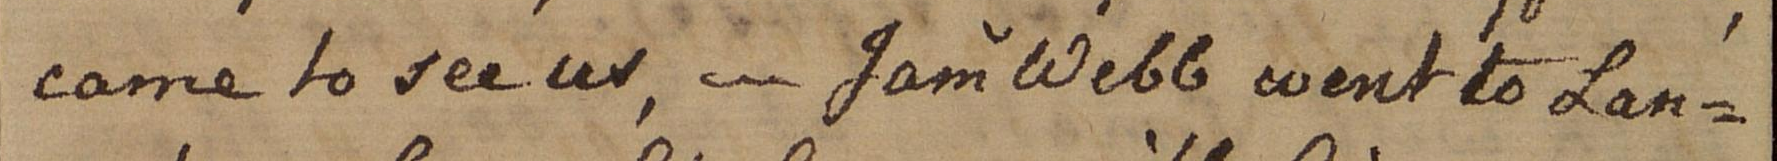came to see us,- Jam Webb went to Lan-
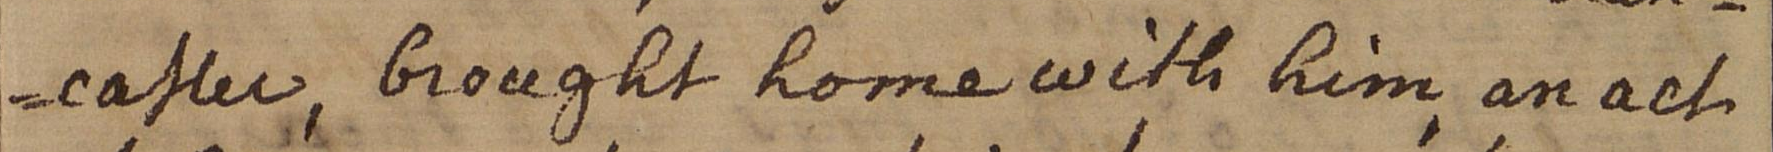-caster, brought home with him an act
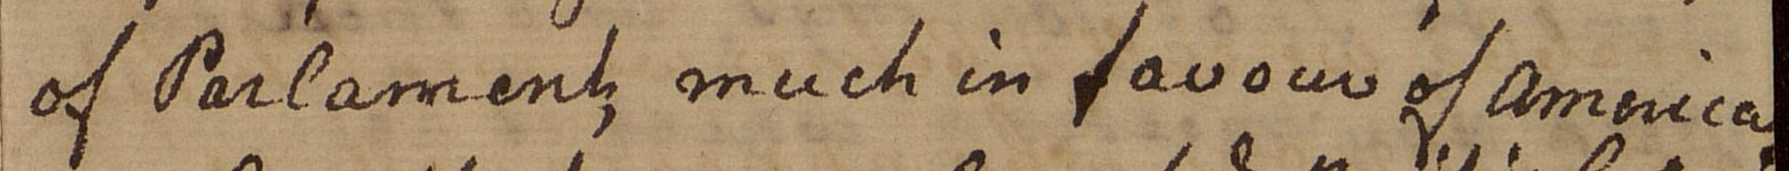of Parlament much in favour of America
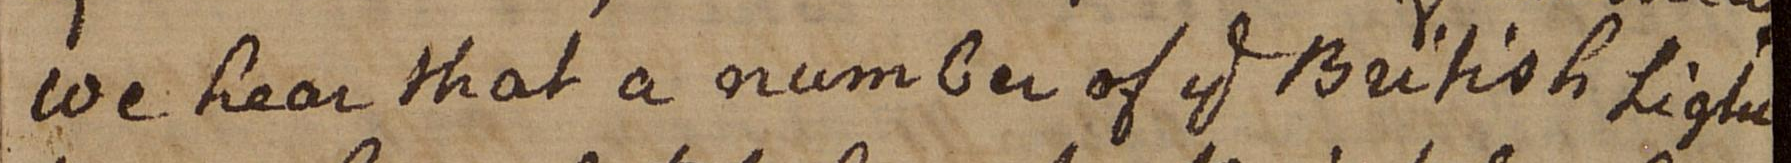we hear that a number of y^e British Light
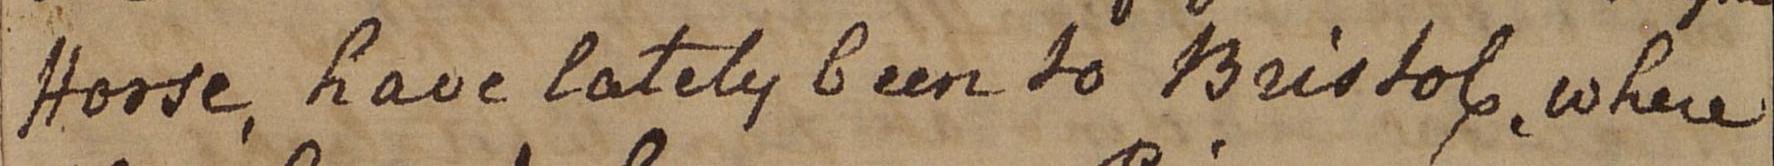Horse, have lately been to Bristol, where
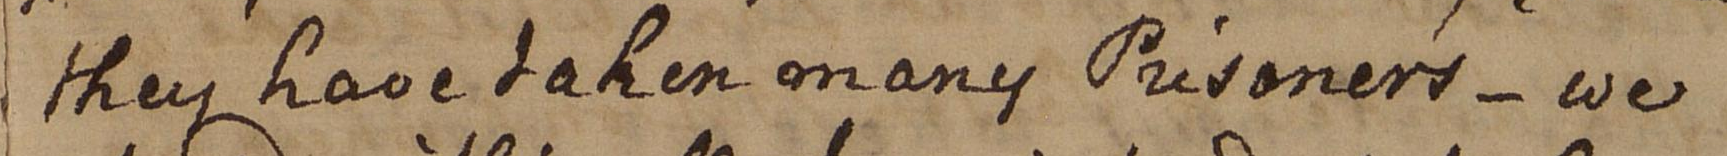they have taken many Prisoners- we
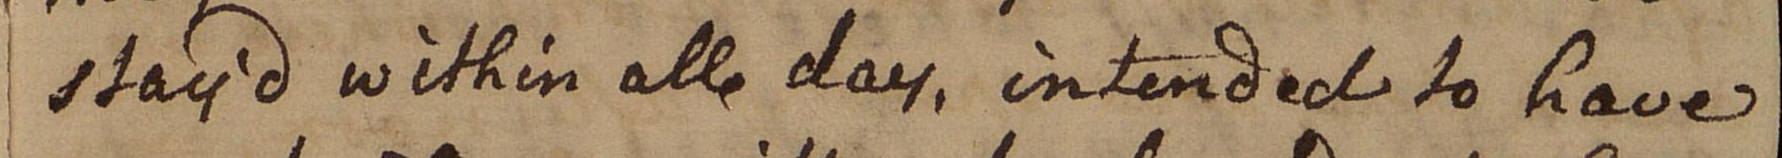stay'd within all day, intended to have
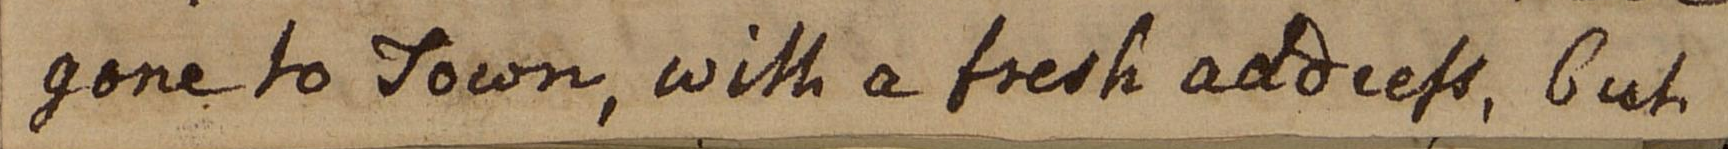gone to Town, with a fresh address, but
